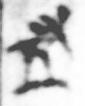○（右）
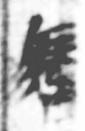○（服）
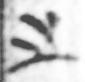之
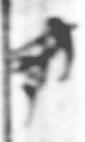邡
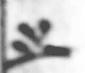之
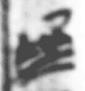爲
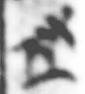○（右）
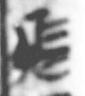飛（騑）
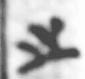之
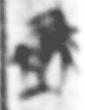端
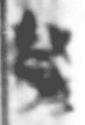轂
